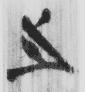之
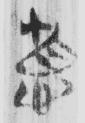惪
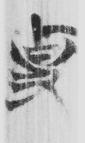史
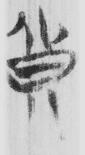貨
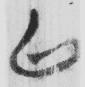㠯（以）
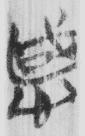惑
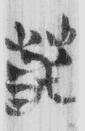萅
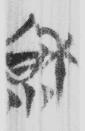{炅禾}
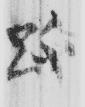改
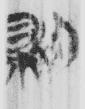則
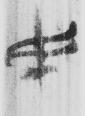民
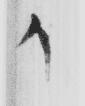人
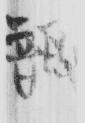諏
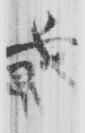貣
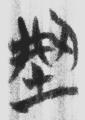型
